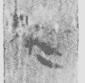九十=
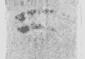二
